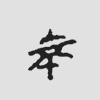不
